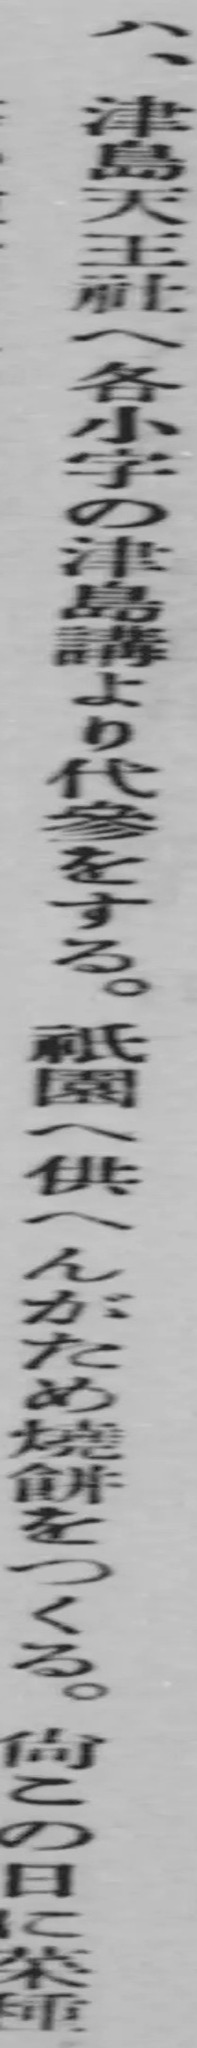ハ、津島天王社へ各小字の津島講より代參をする。祇園へ供へんがため燒餅をつくる。尚この日に菜種
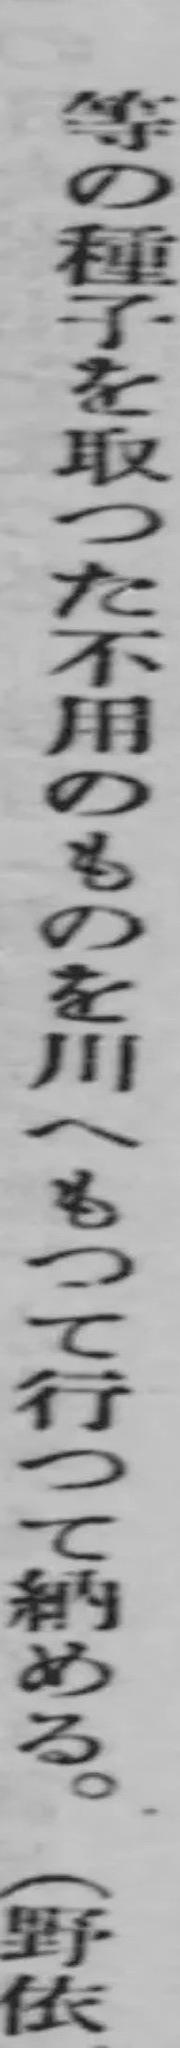等の種子を取つた不用のものを川へもつて行つて納める。(野依)
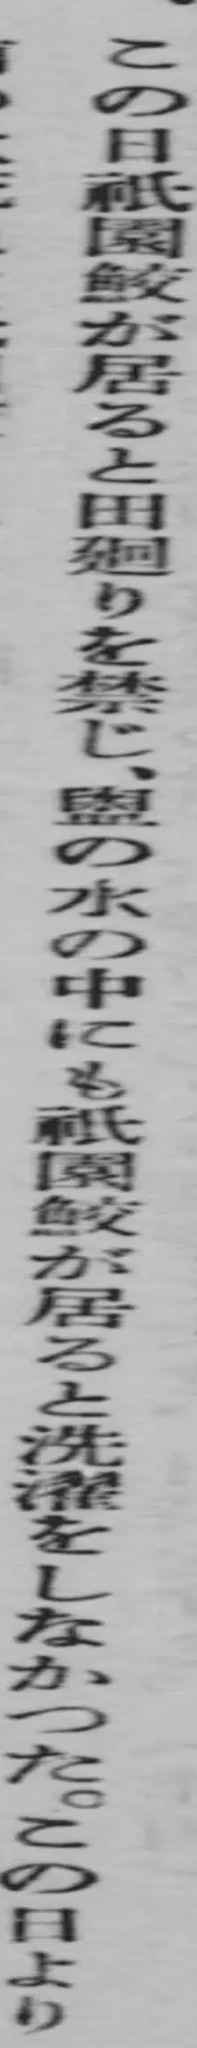ニ、この日祇園鮫が居ると田廻りを禁じ、盥の水の中にも祇園鮫が居ると洗濯をしなかつた。この日より
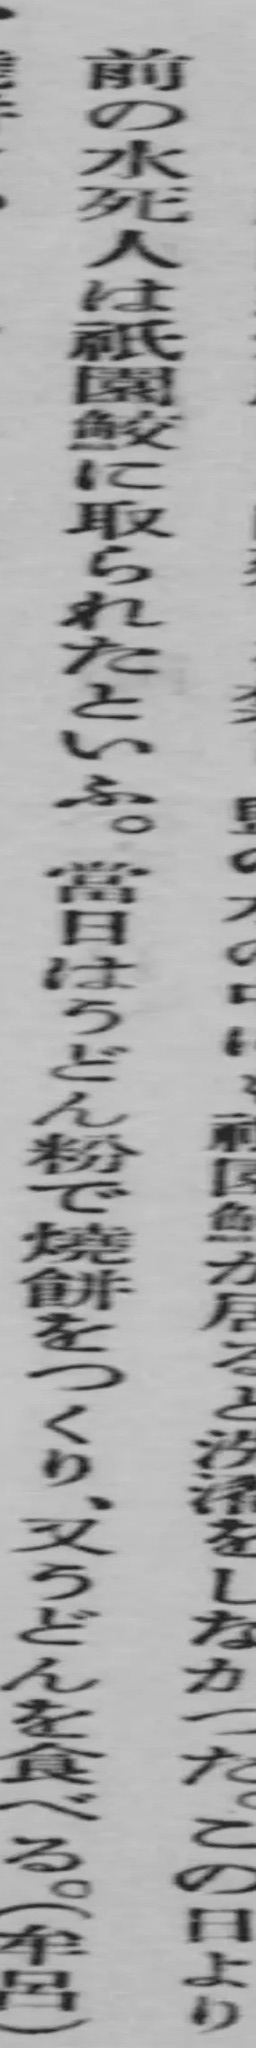前の水死人は祇園鮫に取られたといふ。當日はうどん粉で燒餅をつくり、又うどんを食べる。(牟呂)
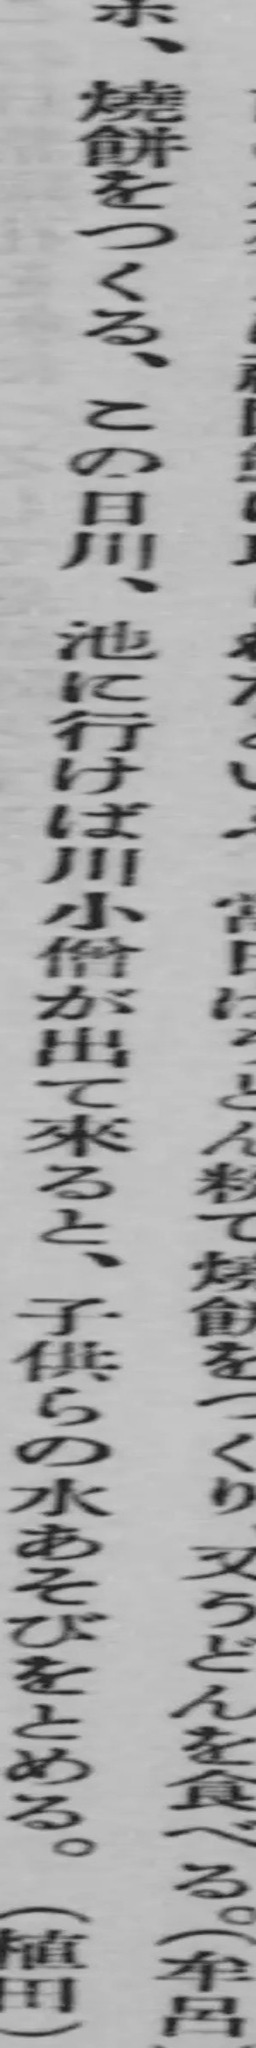ホ、燒餅をつくる。この日川、池に行けば川小憎が出て來ると、子供らの水あそびをとめる。(植田)
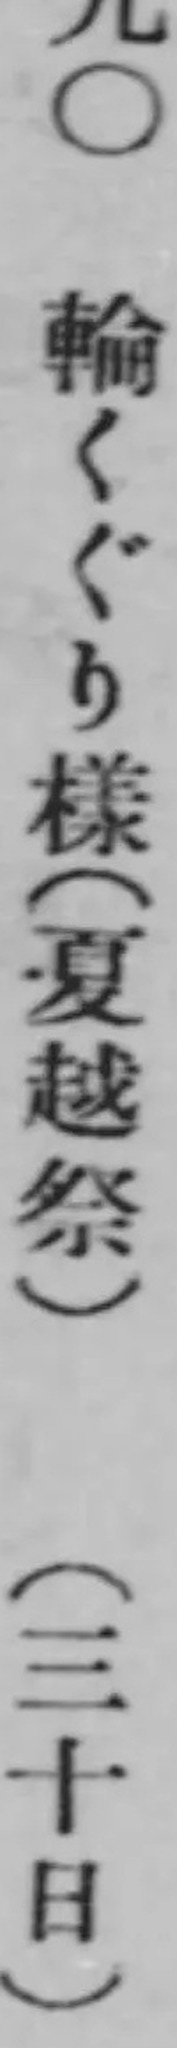九〇輪くぐり様(夏越祭)(三十日)
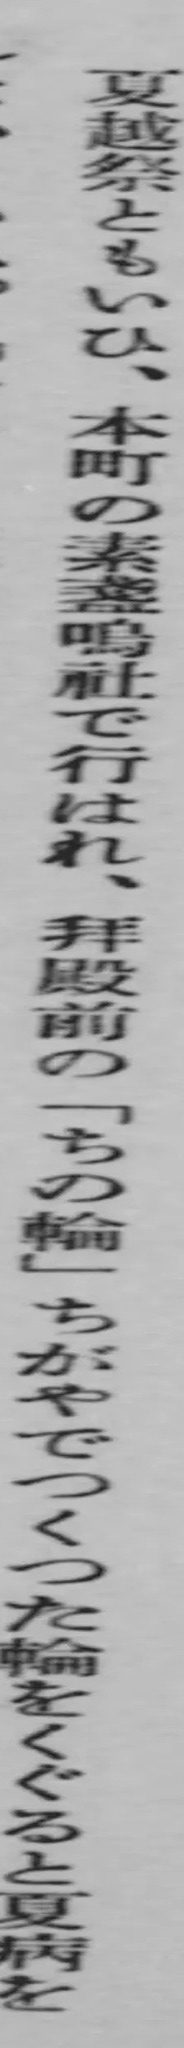夏越祭ともいひ、本町の素盞嗚社で行はれ、拜殿前の「ちの輪」ちがやでつくつた輪をくぐると夏病を
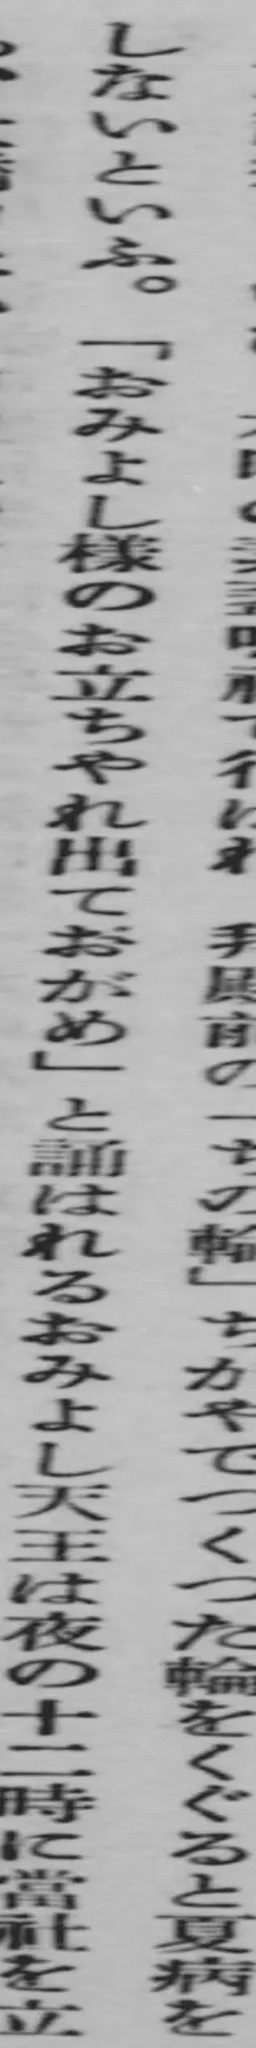しないといふ。「おみよし様のお立ちやれ出ておがめ」と誦はれるおみよし天王は夜の十二時に當社を立
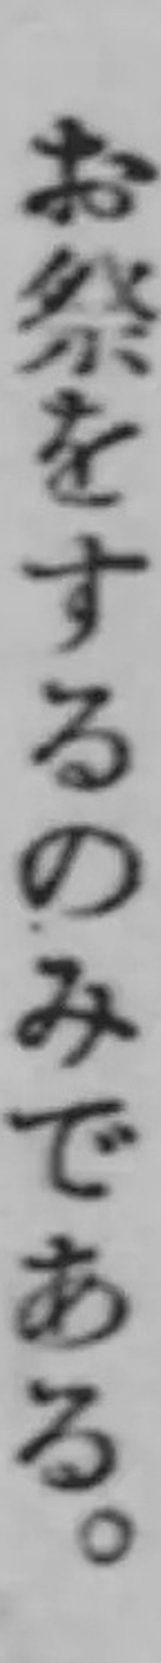お祭をするのみである。
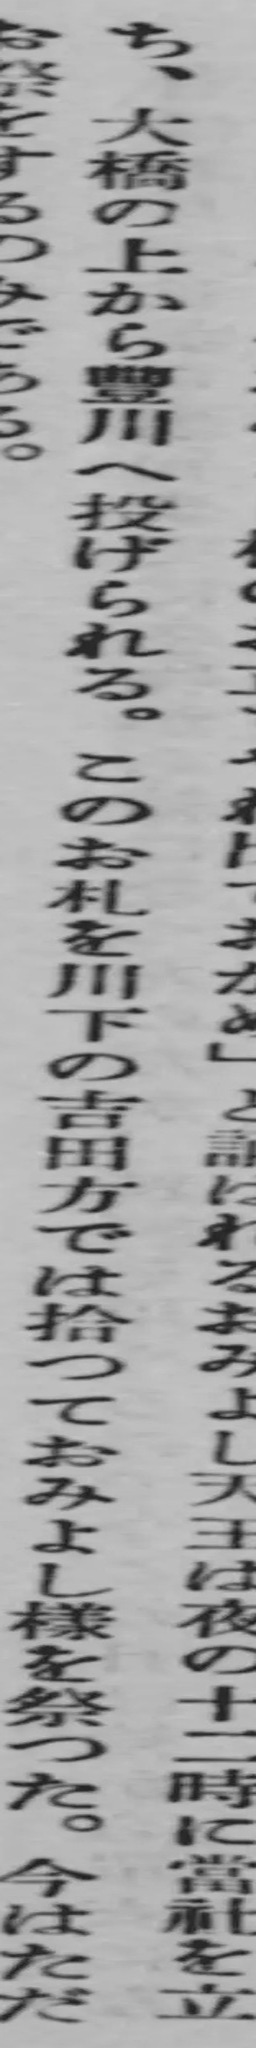ち、大橋の上から豐川へ投げられる。このお札を川下の吉田方では拾つておみよし様を祭つた。今はただ
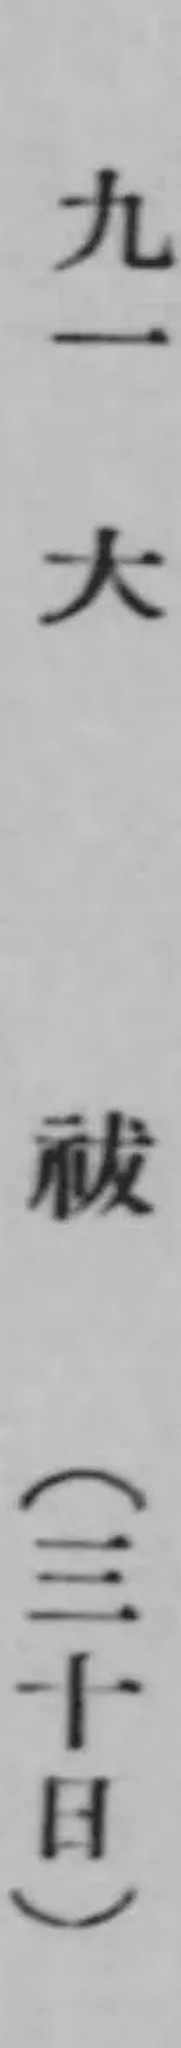九一大祓(三十日)
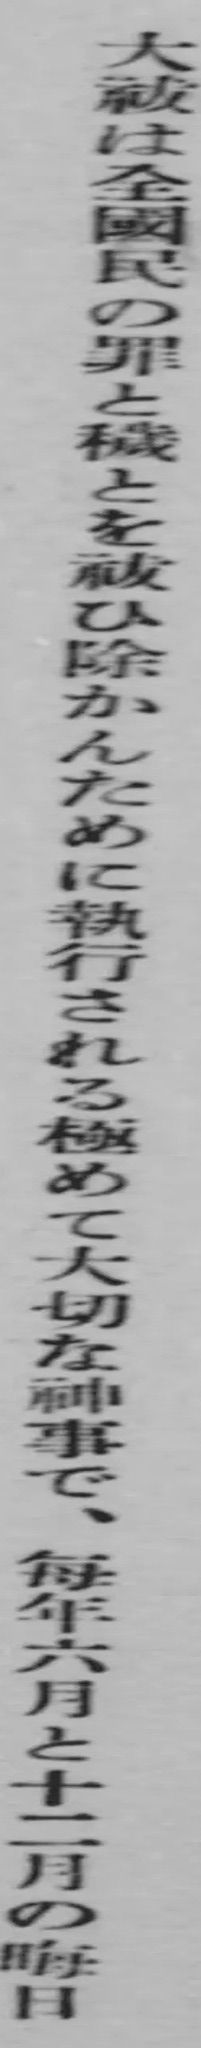大祓は全國民の罪と穢とを祓ひ除かんために執行される極めて大切な神事で、每年六月と十二月の晦日
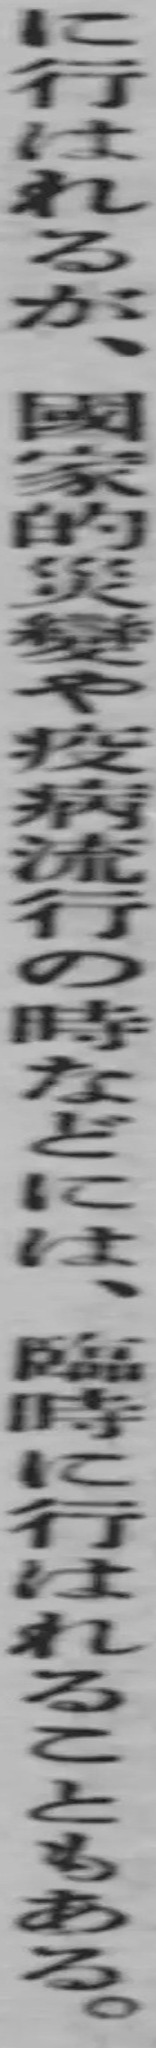に行はれるが、國家的災變や疫病流行の時などには、臨時に行はれることもある。
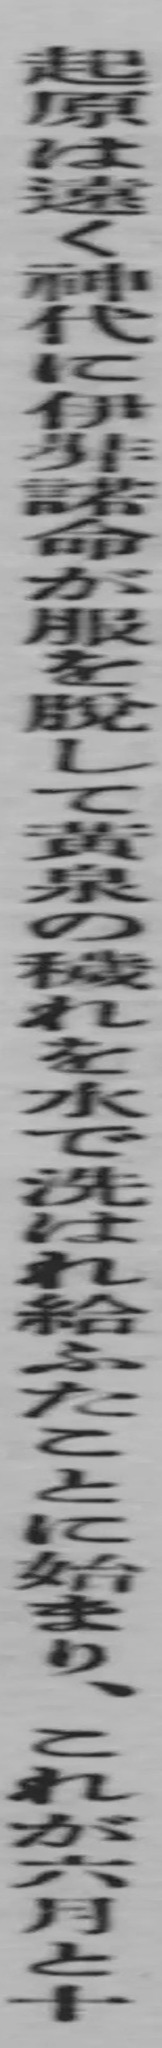起原は遠く神代に伊弉諾命が服を脫して黄泉の穢れを水で洗はれ給ふたことに始まり、これが六月と十
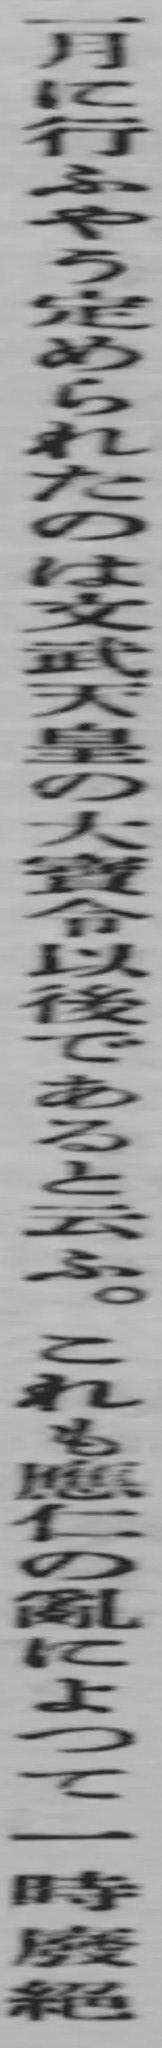二月に行ふやう定められたのは文武天皇の大寶令以後であると云ふ。これも應仁の亂によつて一時廢絕
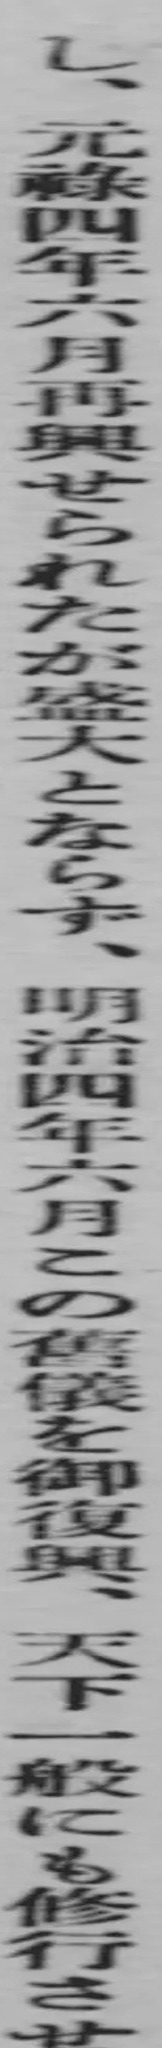し、元祿四年六月再興せられたが盛大とならず、明治四年六月この舊儀を御復興、天下一般にも修行させ
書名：豊橋の年中行事
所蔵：国立国会図書館 National Diet Library, JAPAN
